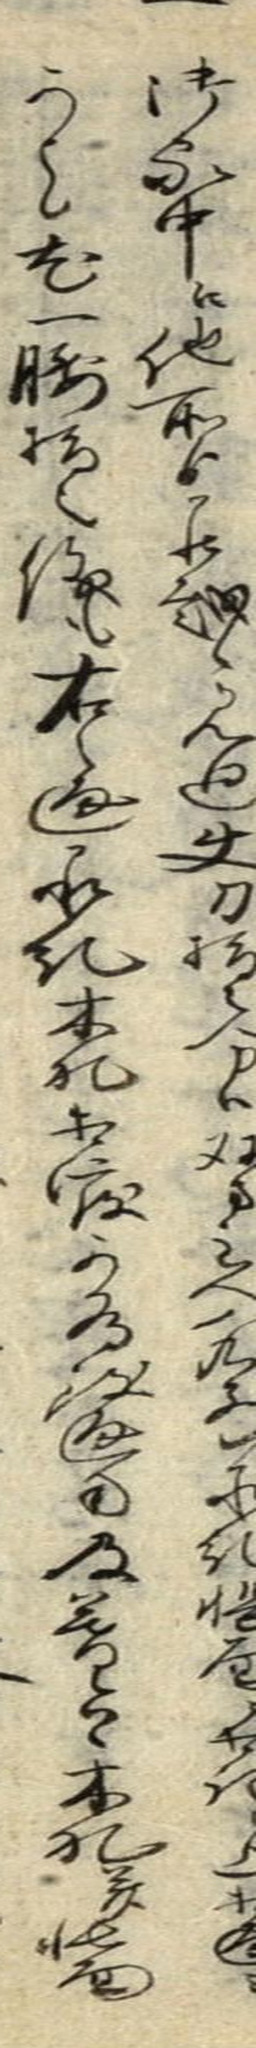可申候尤一腰指之儀も右之通承糺木札相渡可為致通用及暮候はゝ木札幷帳面
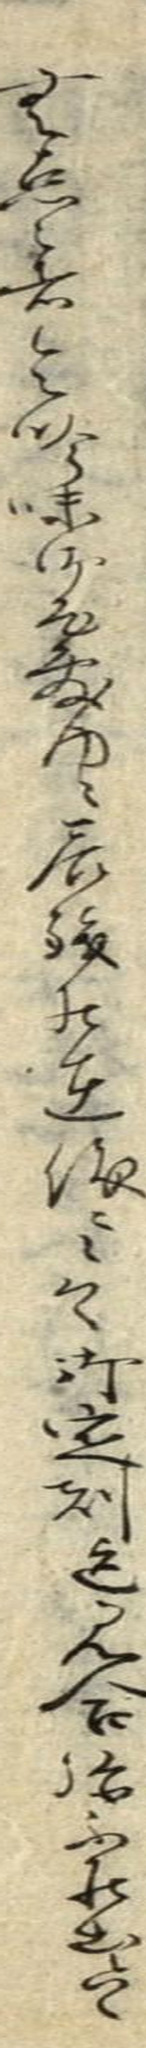無点之者令吟味御屋敷内に居残罷在儀に候はゝ御定刻迄見合弥不罷出候はゝ
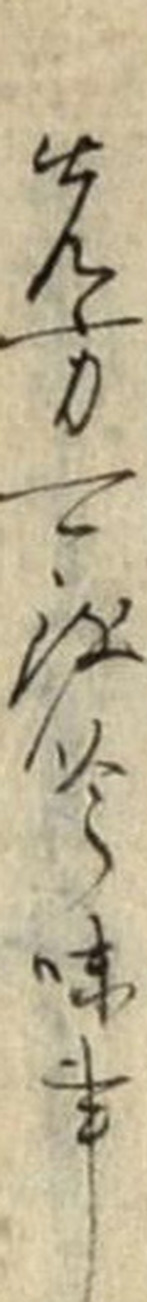先方可致吟味事
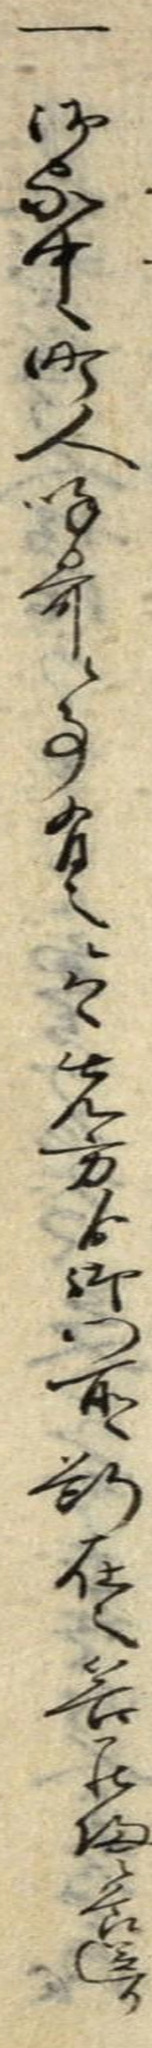一御家中へ町人呼寄候事有之候はゝ先方ゟ御門所へ断在之筈罷帰候節送り

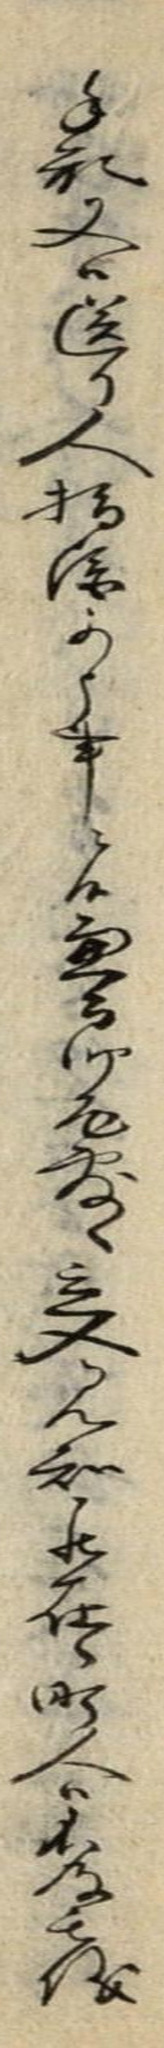手形又は送り人指添可申事に候兼て御屋敷へ立入見知罷在候町人は不及其儀
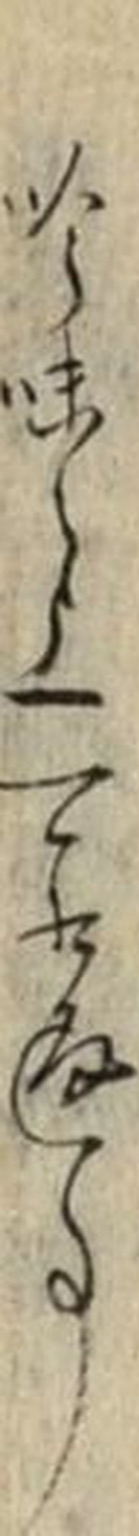吟味之上可相通事
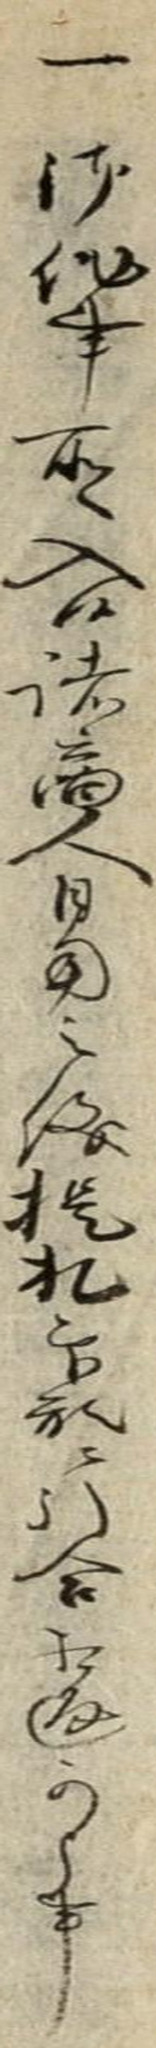一御作事所へ入候諸商人日用之儀提札印形に引合相通可申事
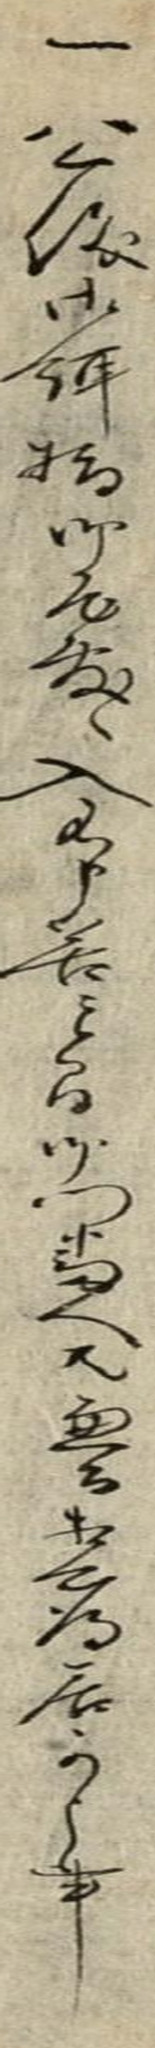一公儀御餌指御屋敷へ入不申筈に候間御門番人共兼て相心得居可申事
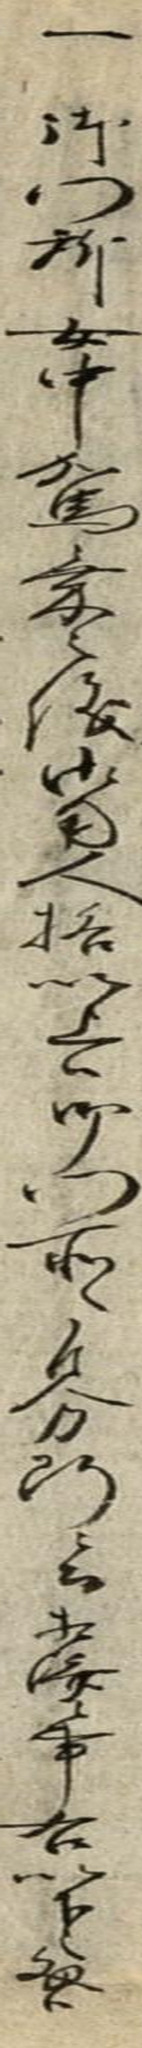一御門所女中駕乗之儀御用人格以上は御門所へ自分断にて相済候事右以下之義は
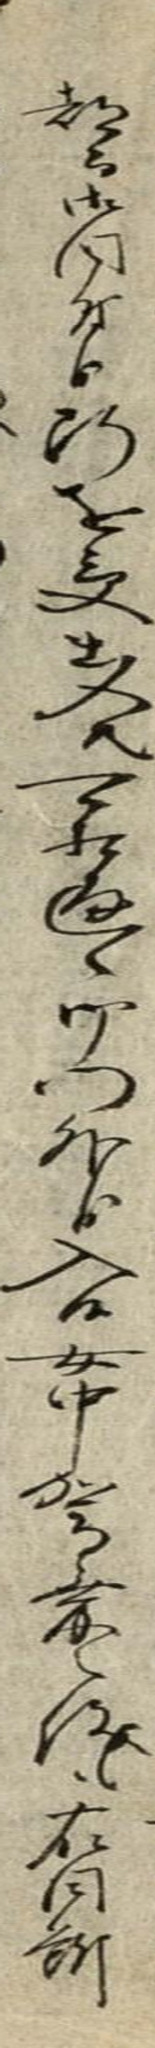都て御目付ゟ断を受出入共可相通候御門外ゟ入候女中駕乗之儀も右同断
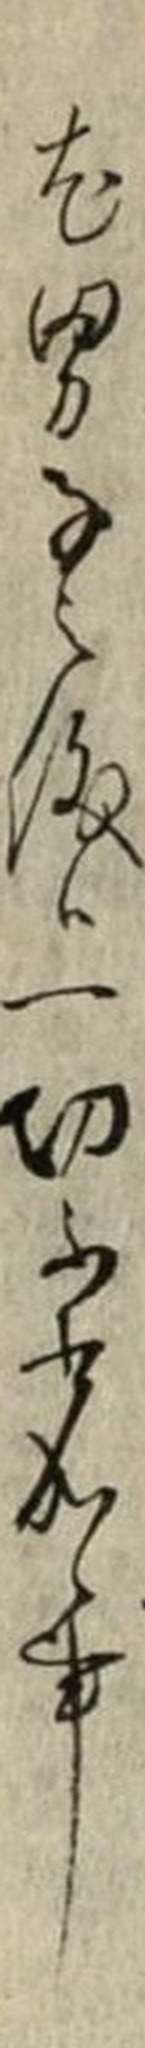尤男子之儀は一切不相成候事
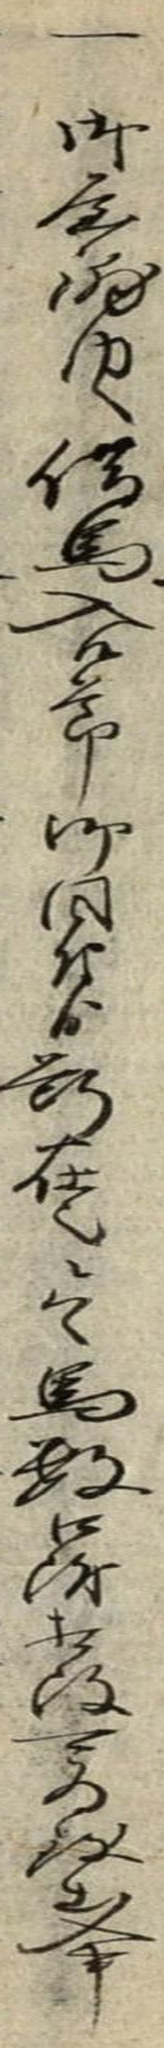一御屋鋪内へ借馬入候節御目付ゟ断在之候はゝ馬数口附相改可為致出入事
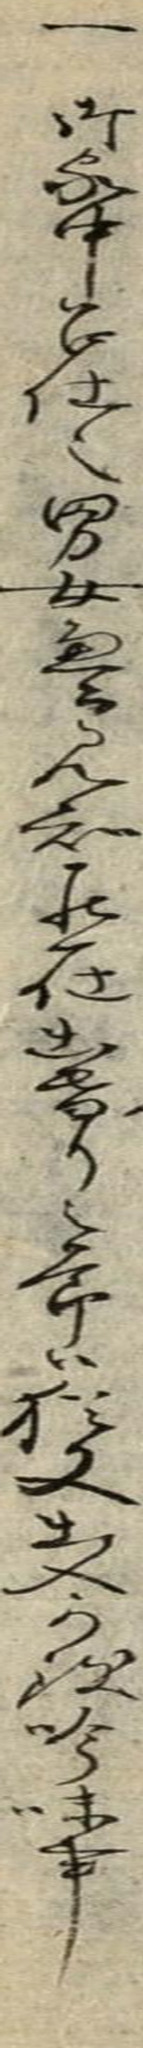一御家中召仕之男女兼て見知罷在出替り之節は猶又出入可致吟味事
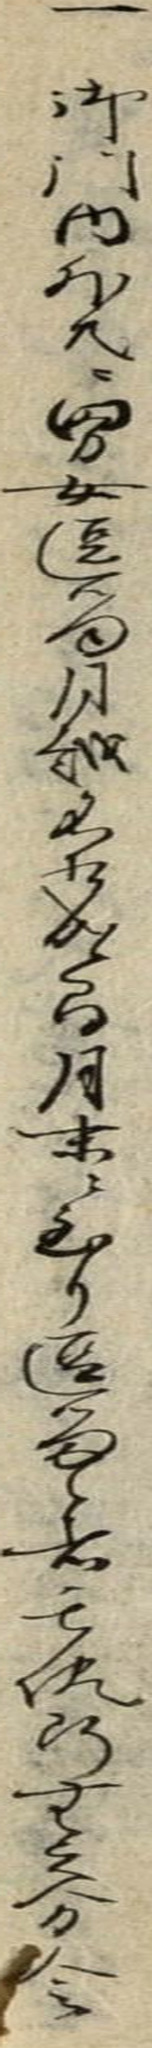一御門内外共に男女逗留月越不相成候間月末に至り逗留之者其儘断無之分令
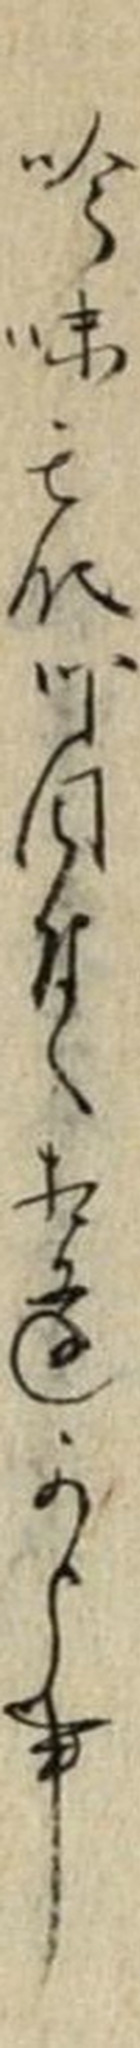吟味其段御目付へ相達可申事
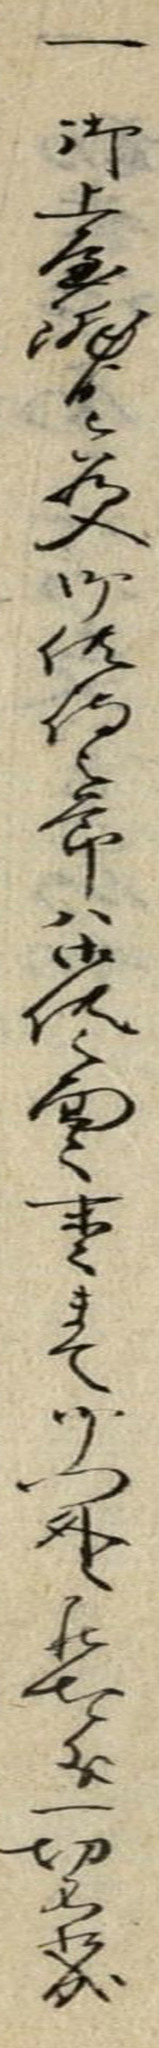一御上屋鋪ゟ被為入御供侍之節は御供之面々末々まて御門外へ罷出候義一切不相成
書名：三都并道中之部
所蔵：福井県文書館 Fukui Prefectural Archives
